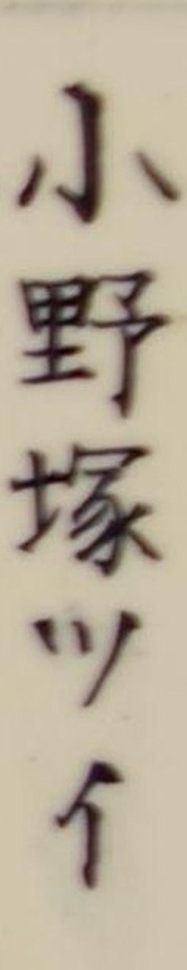小野塚ツイ
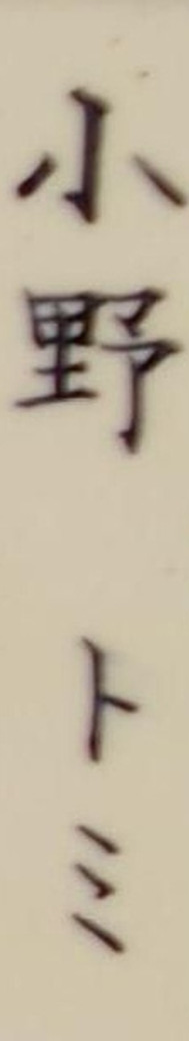小野トミ
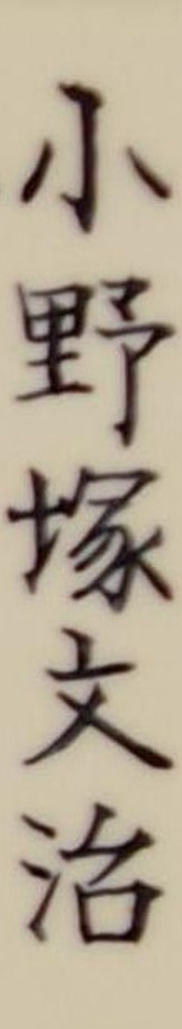小野塚文治
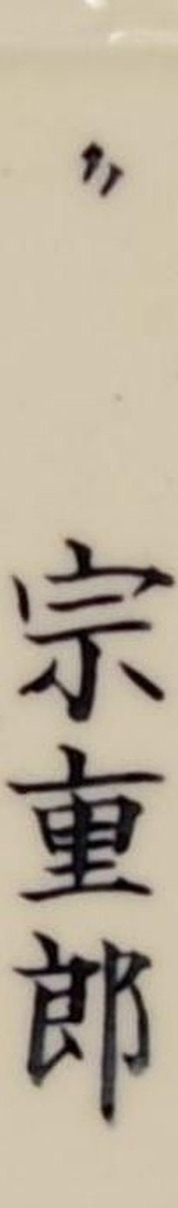宗重郎
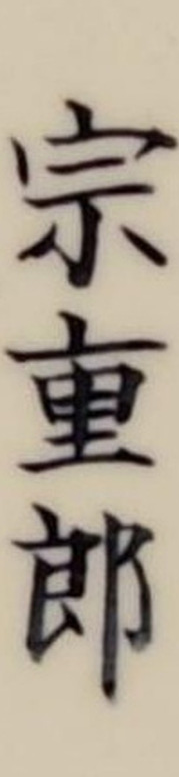宗重郎
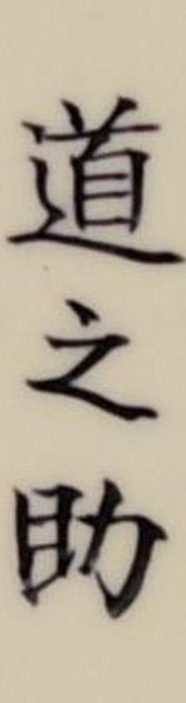道之助
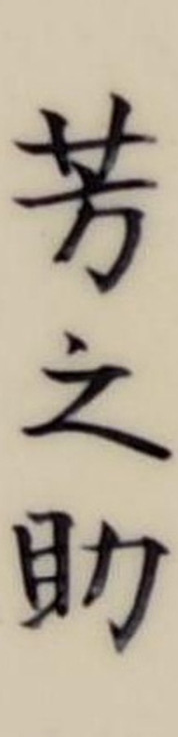芳之助
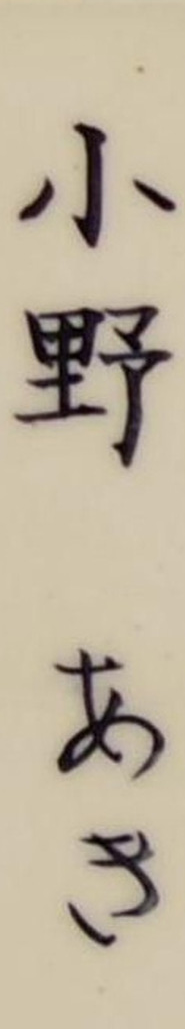小野あき
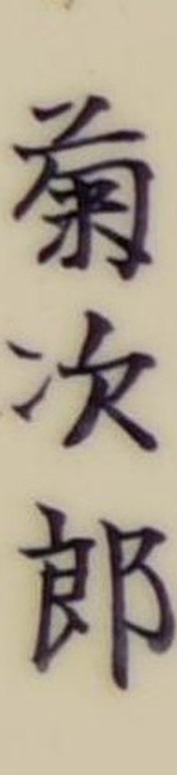菊次郎
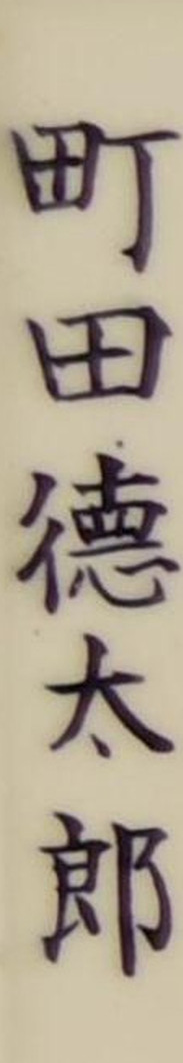町田徳太郎

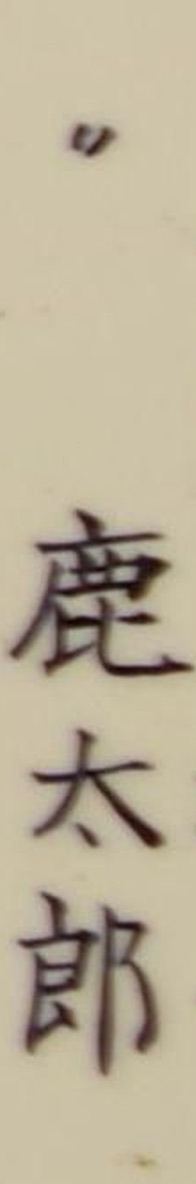鹿太郎
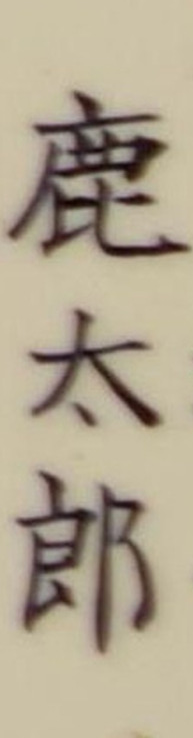鹿太郎
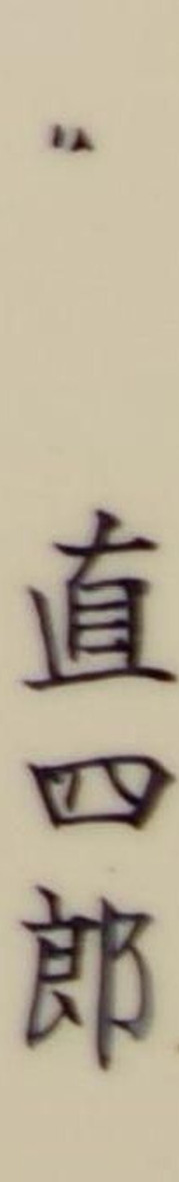直四郎
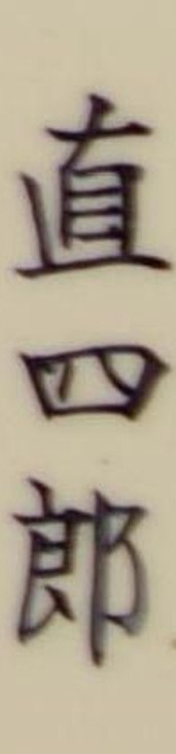直四郎
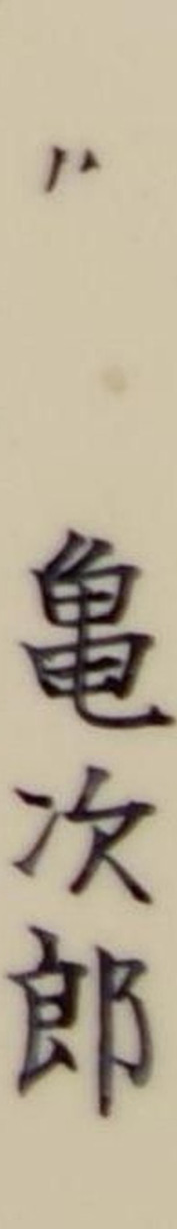亀次郎
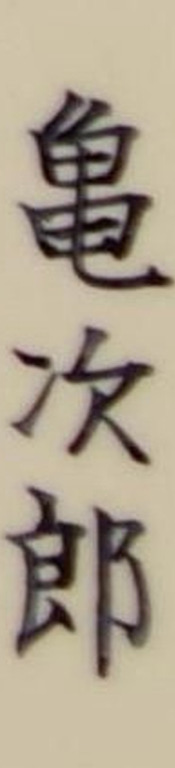亀次郎
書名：E~L
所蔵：高野山金剛峯寺
